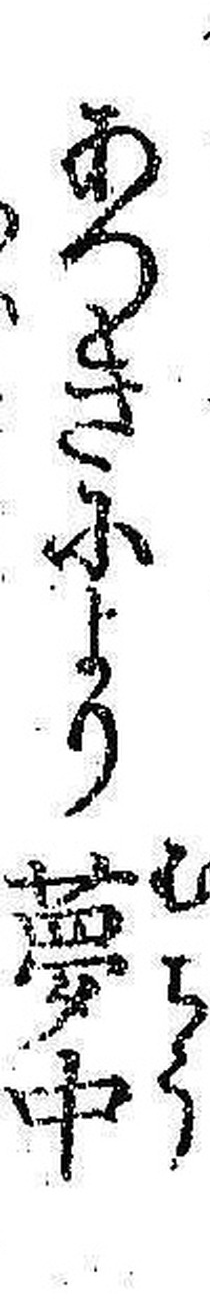あつきにより夢中
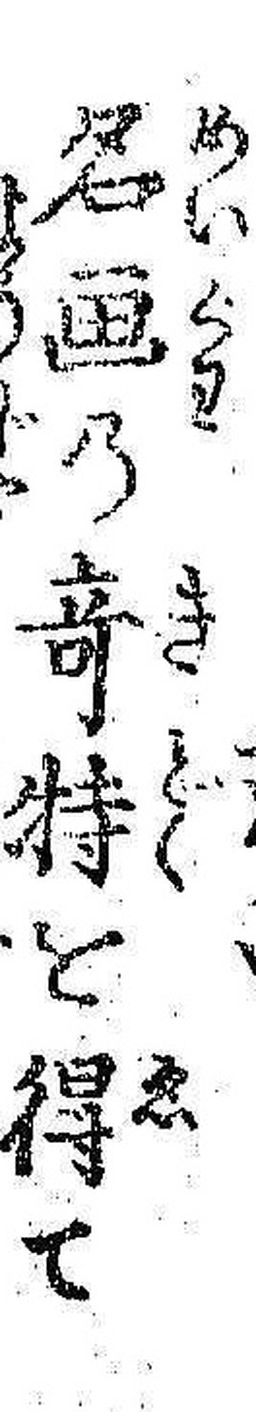名画の奇特を得て
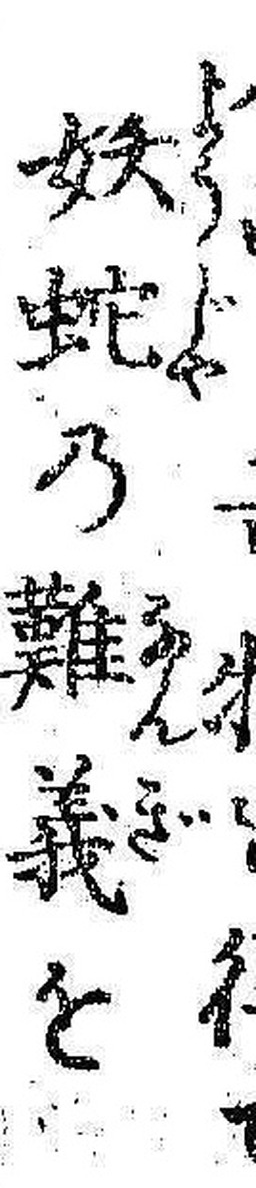妖蛇の難儀を
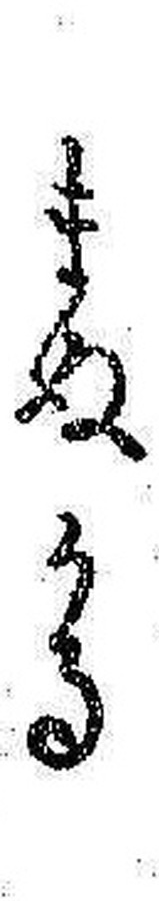まぬかる

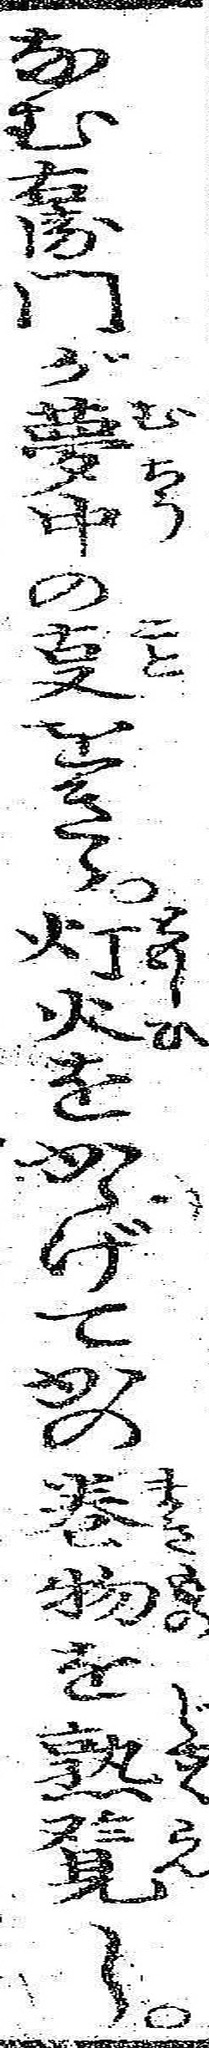なむ右衛門が夢中の事をきゝ。灯火をかゝげてかの巻物を熟覧し。
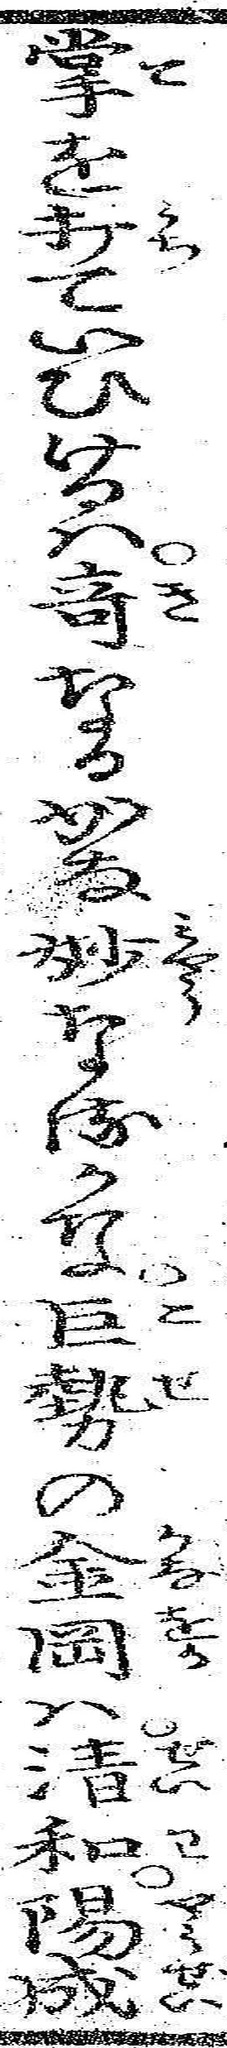掌を打ていひけるは。奇なるかな妙なるかな。巨勢の金岡は。清和。陽成
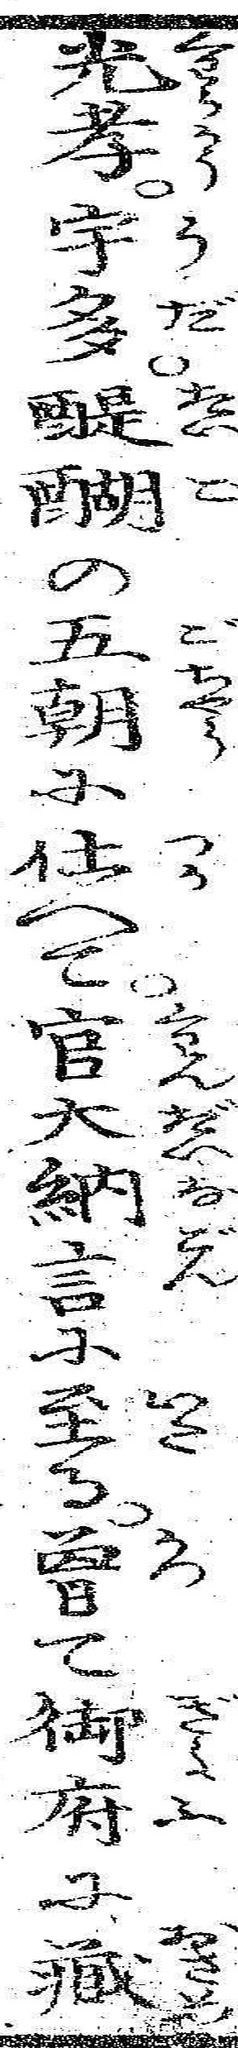光孝。宇多。醍醐の五朝に仕へて。官大納言に至る。曽て御府に蔵
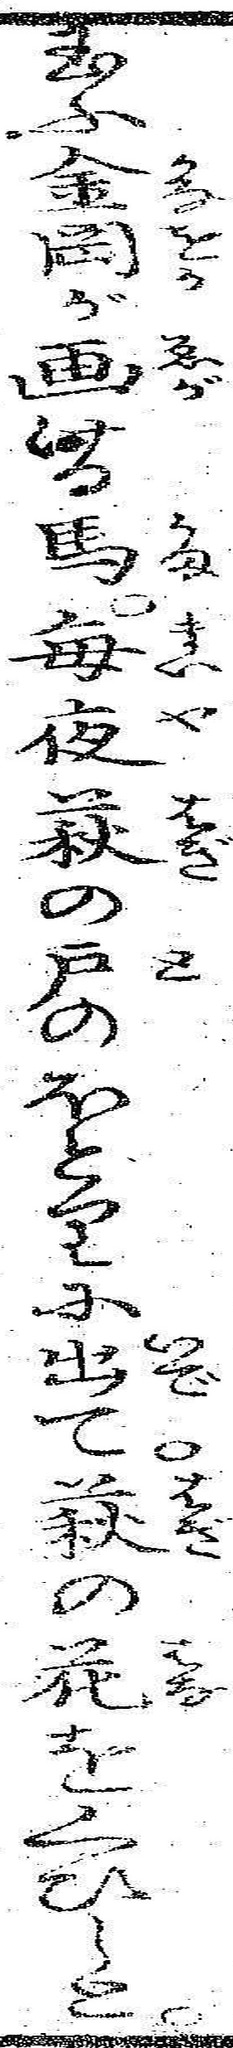玉ふ金岡が画ける馬。毎夜萩の戸のほとりに出て。萩の花をくひしと。
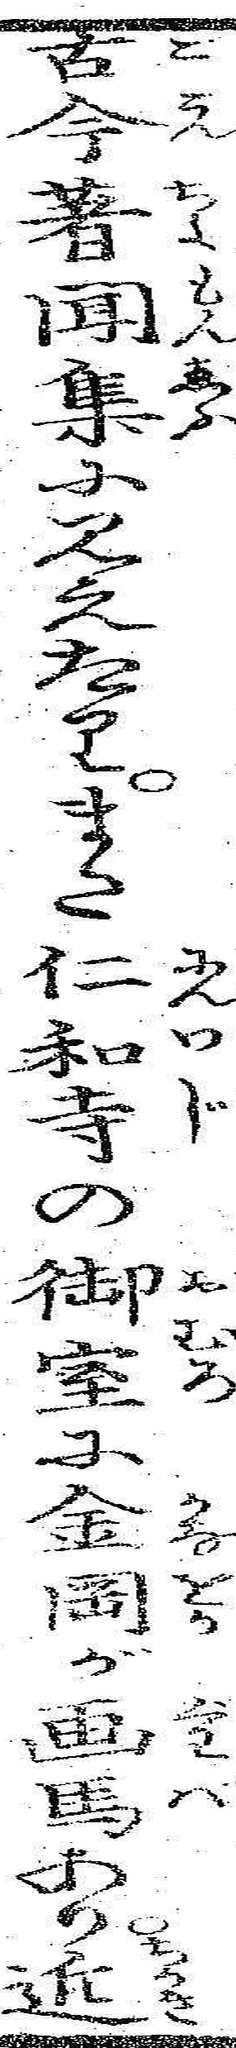古今著聞集に見えたり。また仁和寺の御室に金岡が画馬あり。近
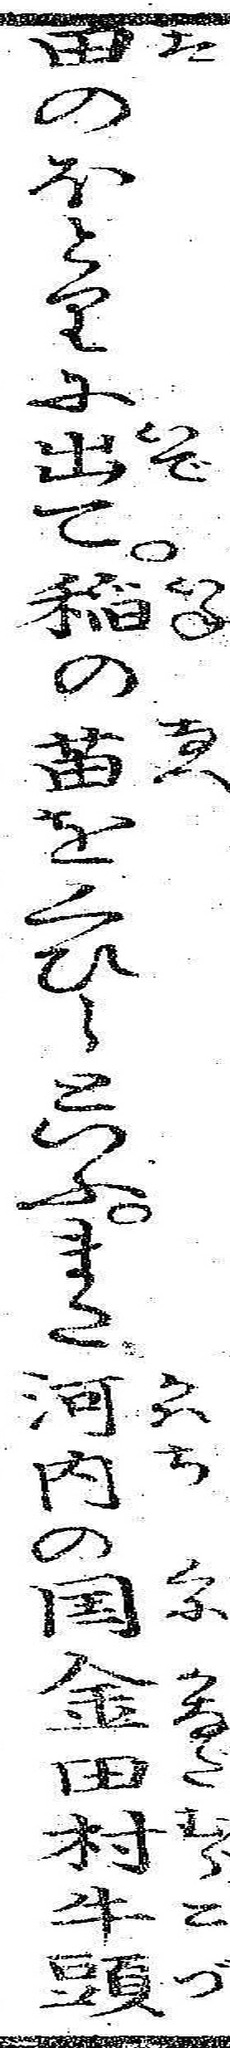田のほとりに出て。稲の苗をくひしといふ。また河内の国金田村牛頭
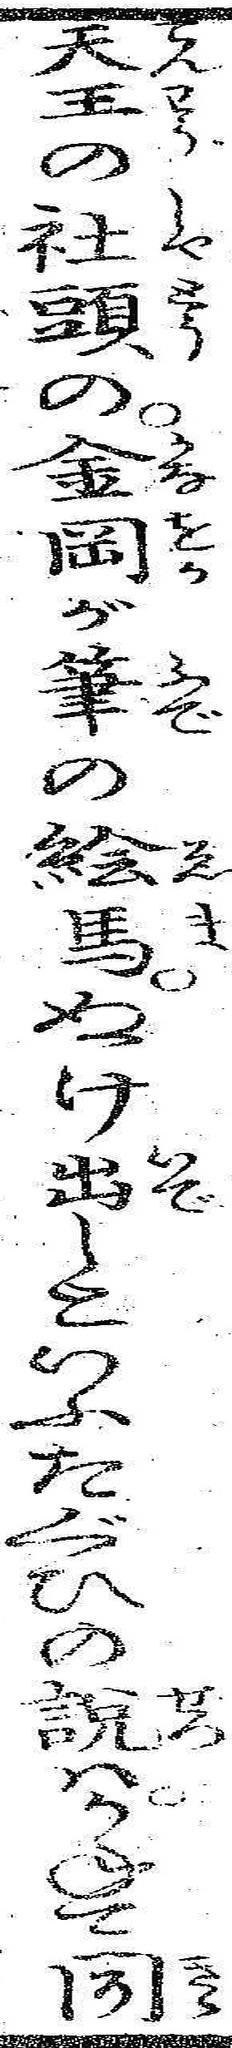天王の社頭の。金岡が筆の絵馬。ぬけ出しといふたぐひの説は。かねて聞
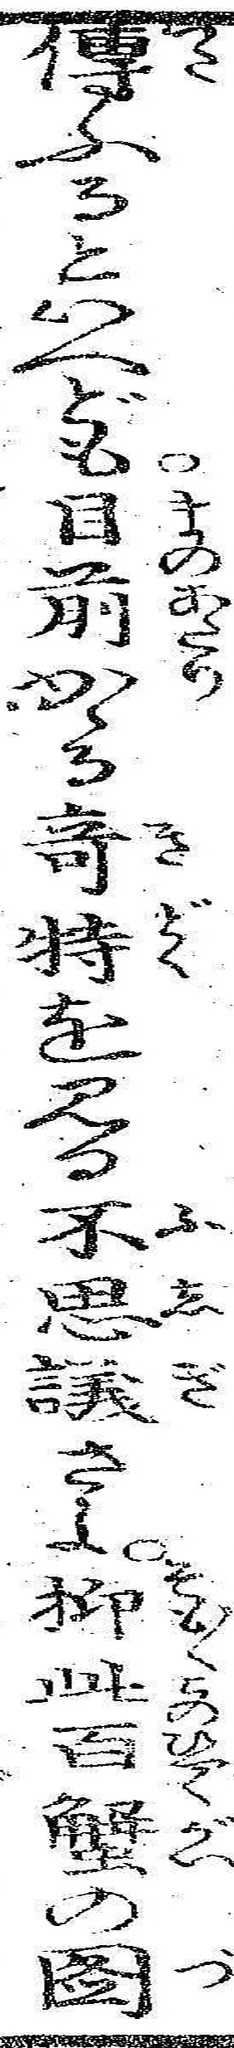伝ふるといへども。目前かゝる奇特を見る不思議さよ。抑此百蟹の図
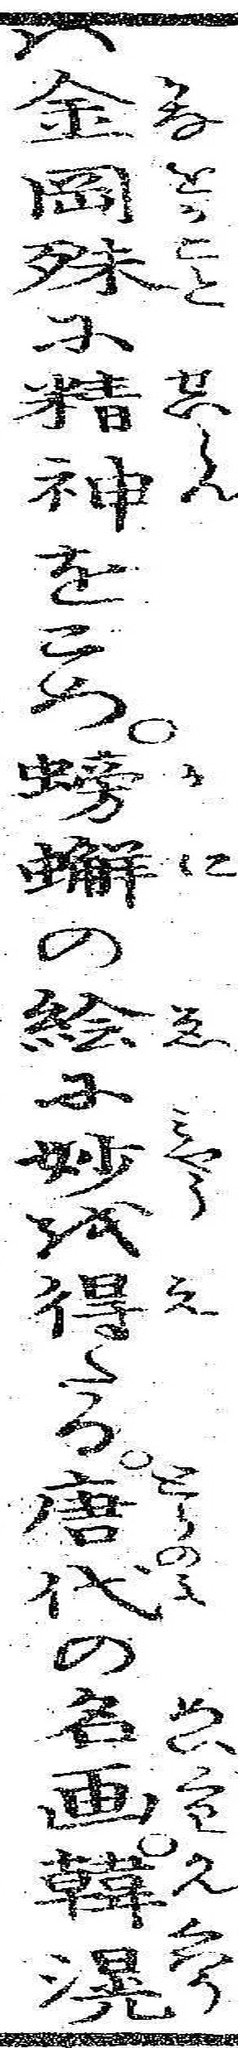は金岡殊に精神をこめ。螃蟹の絵に妙を得たる。唐代の名画。韓滉
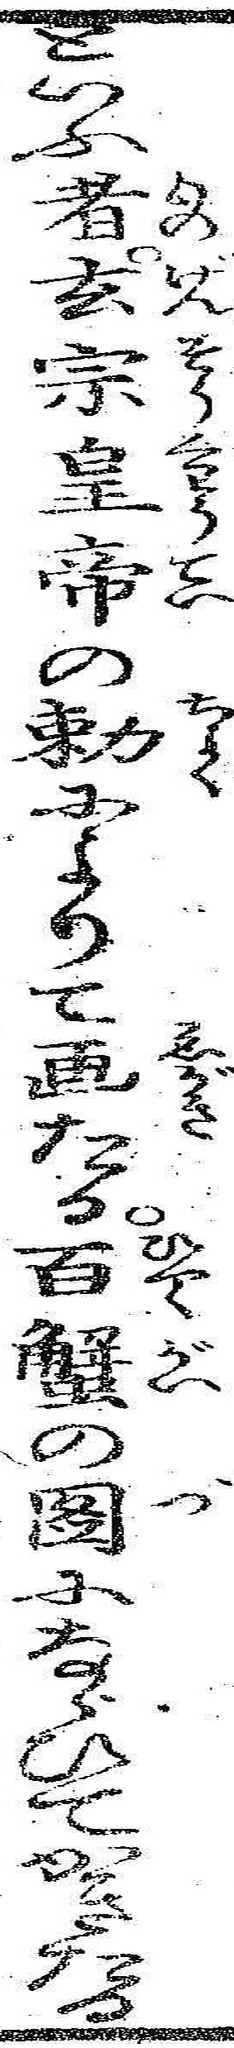といふ者。玄宗皇帝の勅によりて画たる。百蟹の図にならひてかきたる
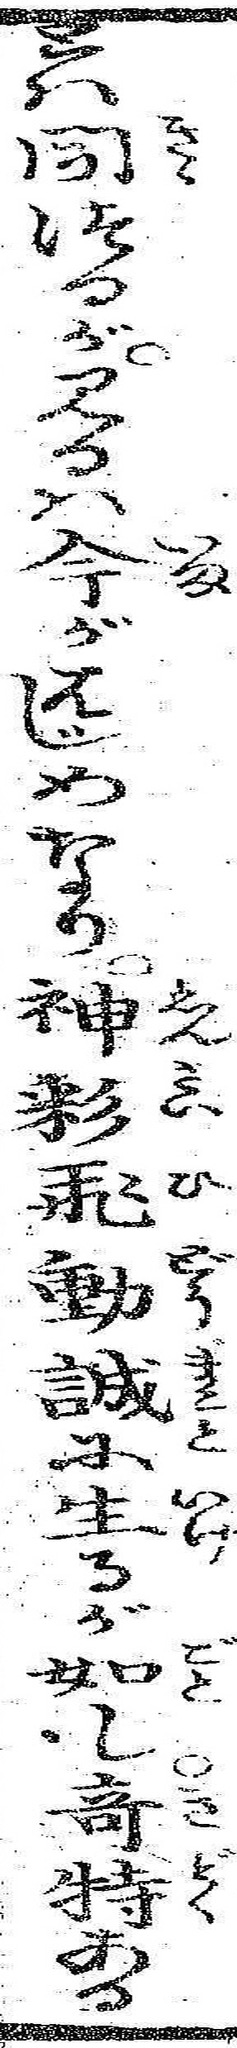とは聞つるが。見るは今がはじめなり。神彩飛動誠に生るが如し。奇特ある
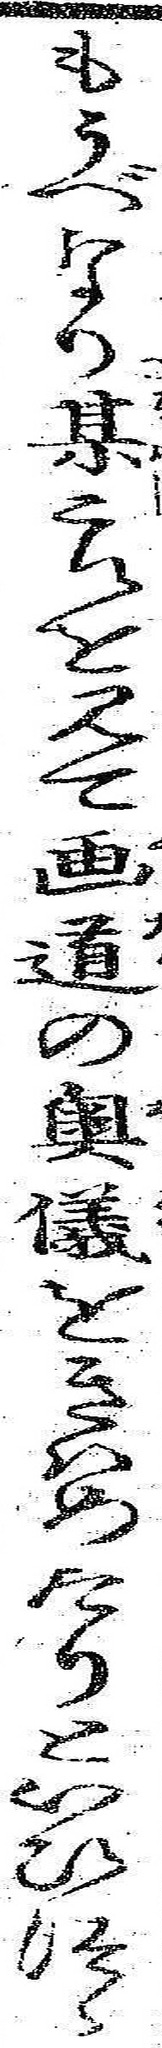もうべなり。某これを見て画道の奥儀をきはめたりといひつゝ
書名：昔話稲妻表紙
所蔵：国文学研究資料館
